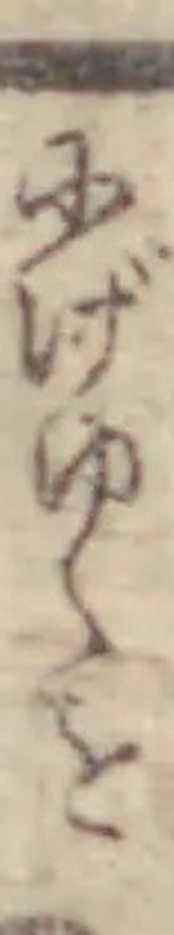にげゆくを
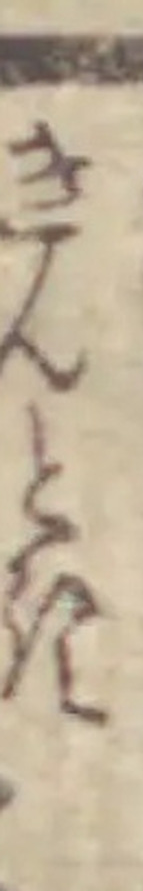きんとき
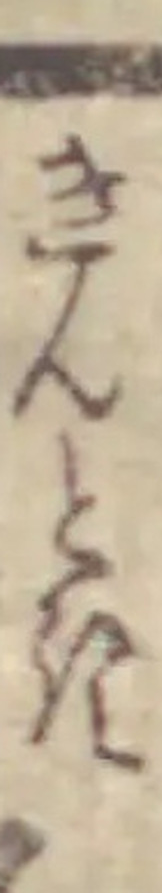きんとき
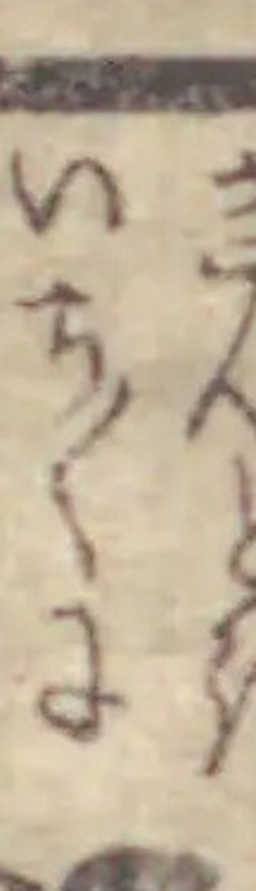いち〳〵に
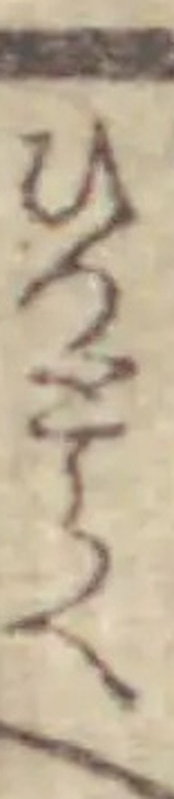ひつとらへ
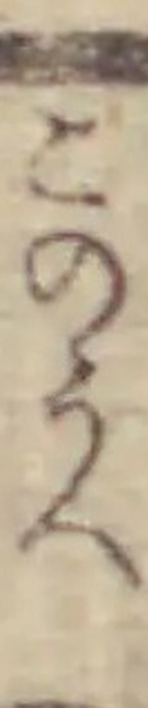このうへ
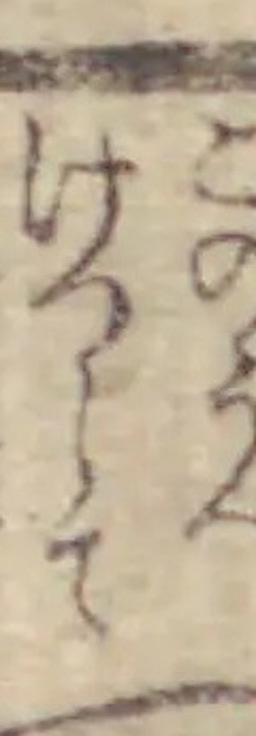けつして
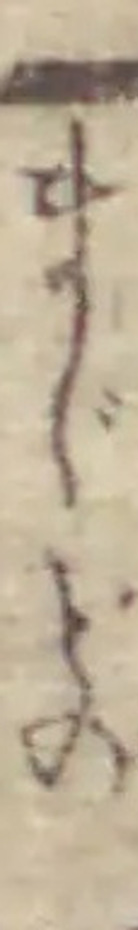まじとの
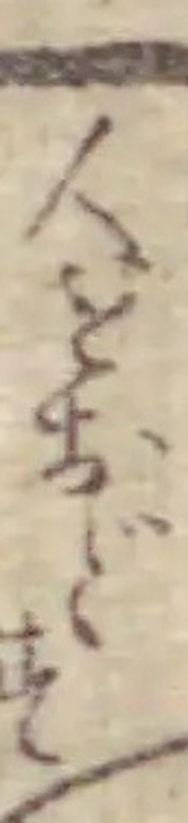人をおどす
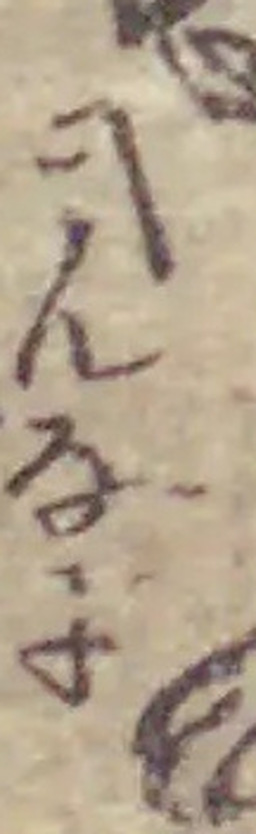〽こんなに
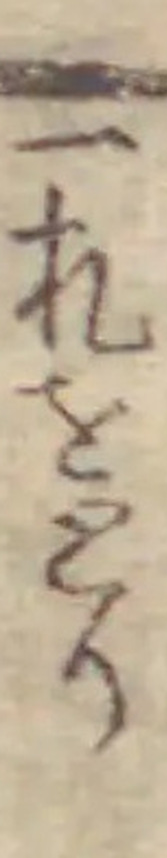一札をとり
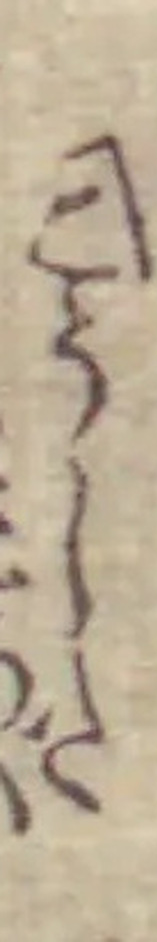〽こうした
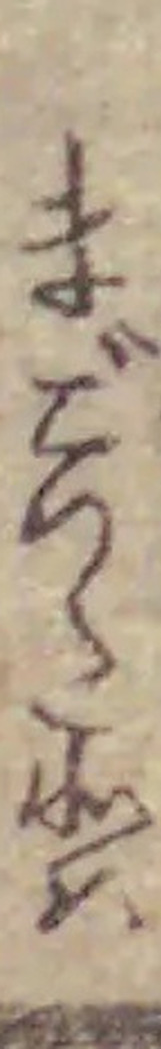まごつた所は
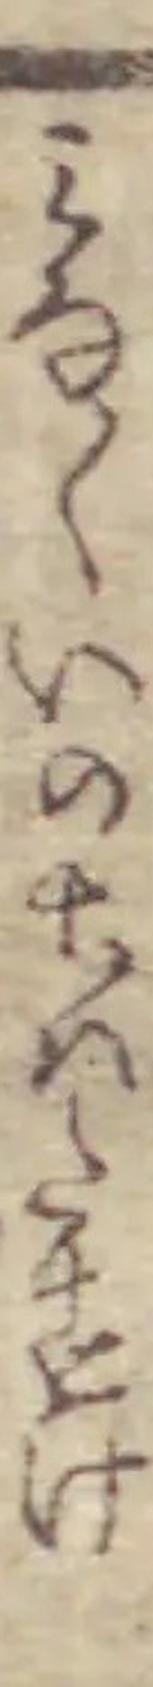みな〳〵いのちはたすけ
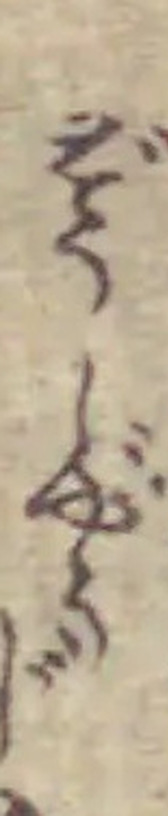どうじやう
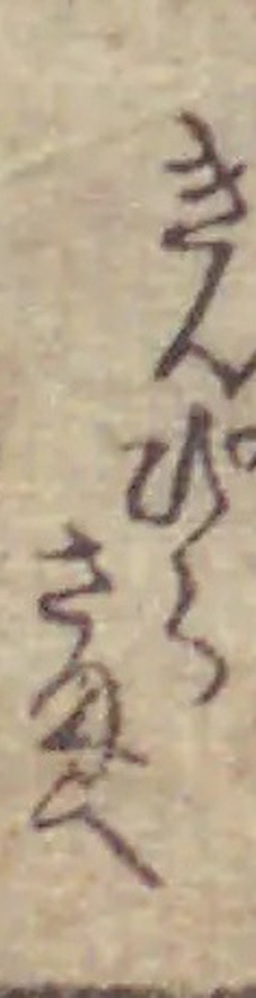さまへ
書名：化物敵討 2巻
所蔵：国立国会図書館 National Diet Library, JAPAN
